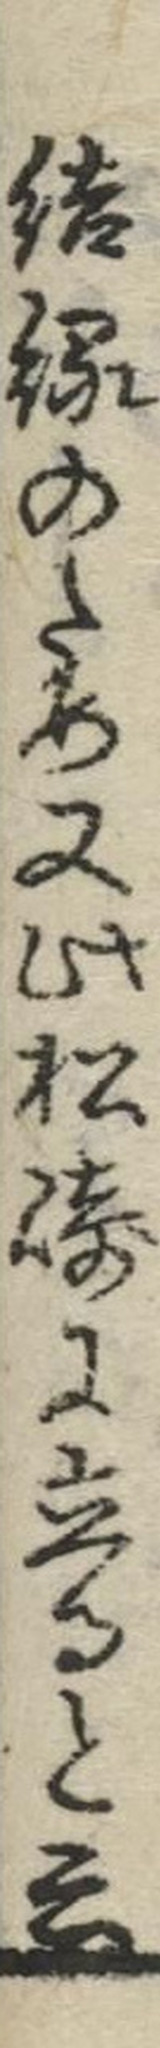結縁のため又此松崎に立ると云
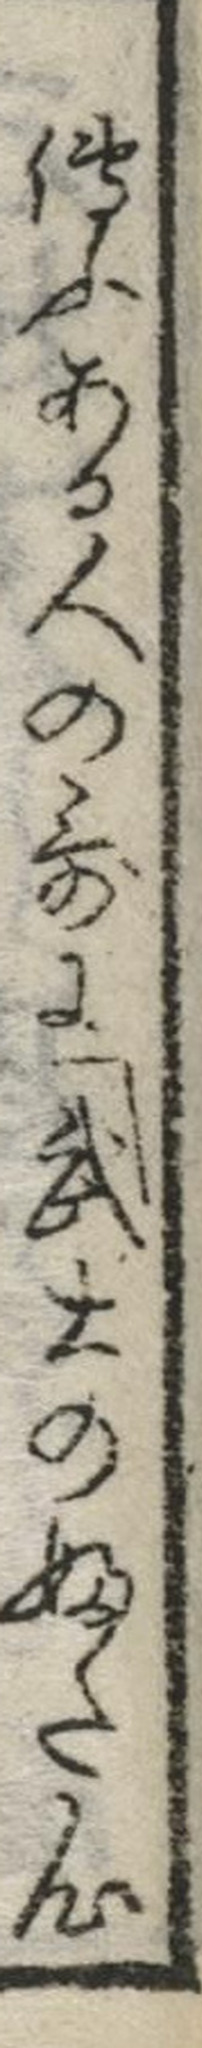伝ふある人の歌に〽武士のふた心
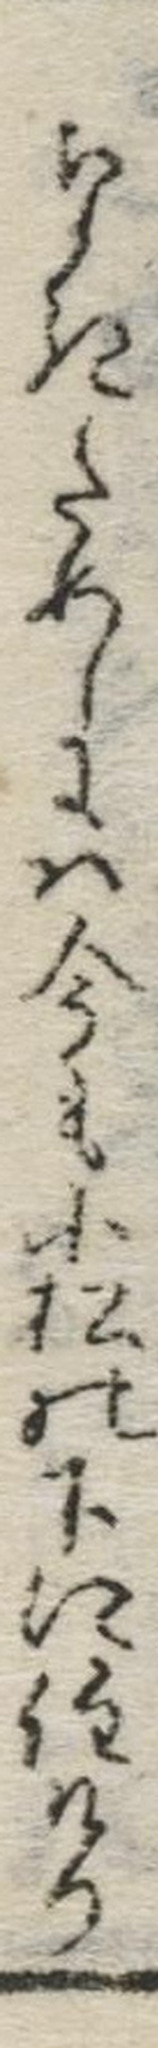なきためしには今も小松の下に住けり
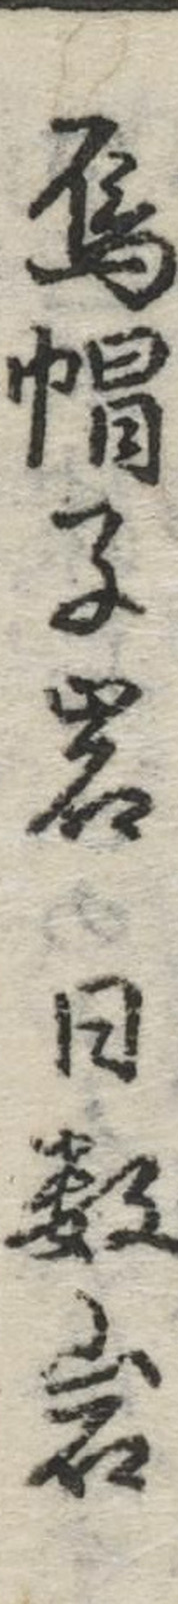烏帽子岩日数岩
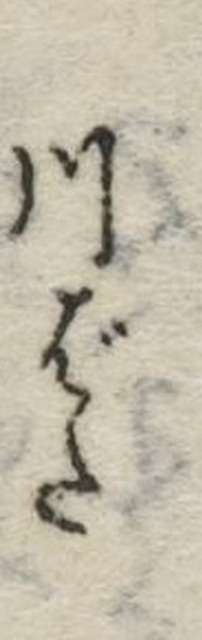川ばた
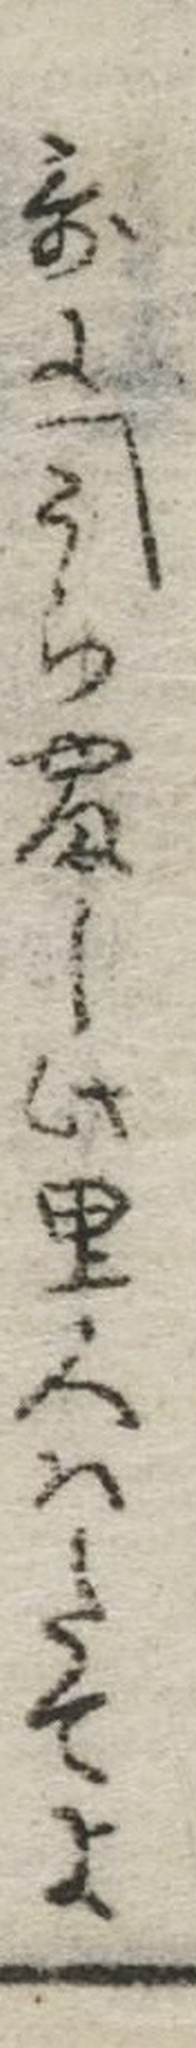歌に〽うらやまし此里人はたてよ
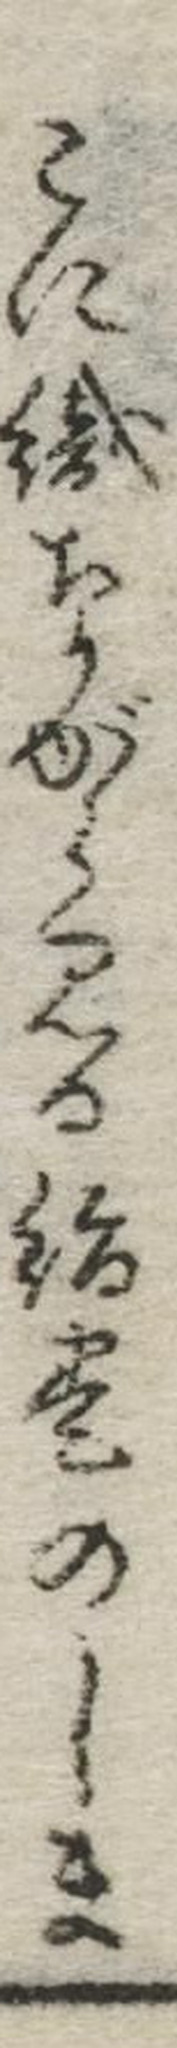こに織ながら見る絹巻のしま
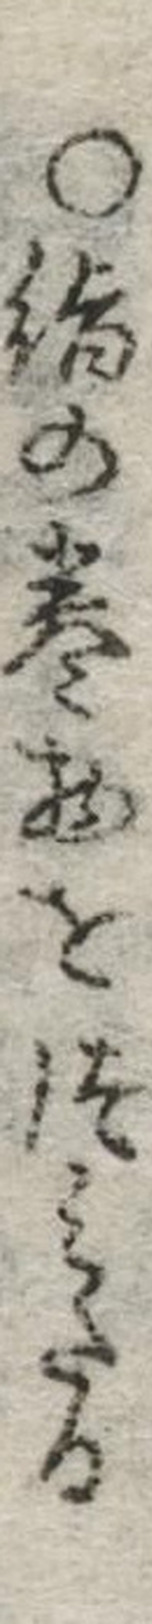○絹の巻物をつみたる
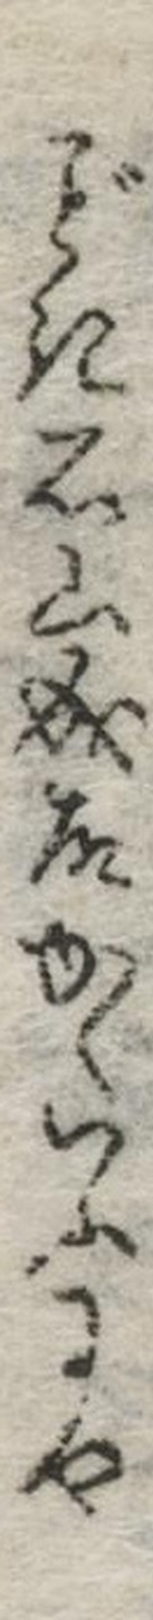ごとき石山成故かくいふにや
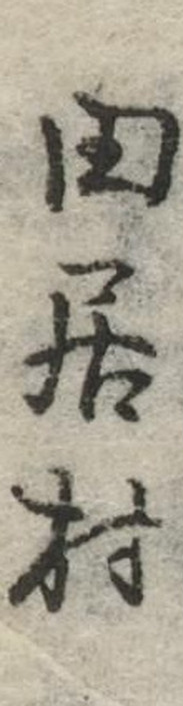田居村

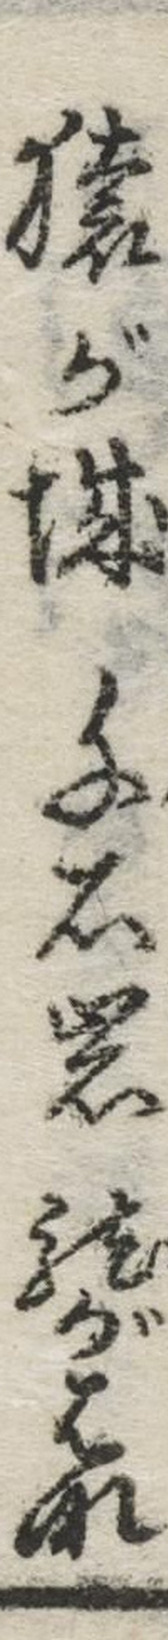猿が城千石岩龍がはな
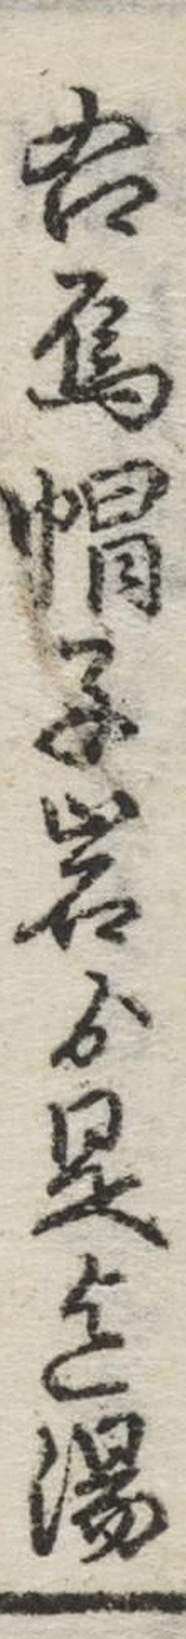右鳥帽子岩ゟ是迄湯
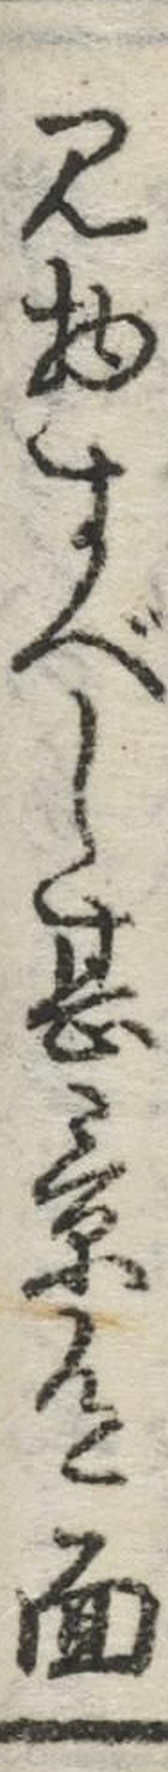見物すべし甚景色面
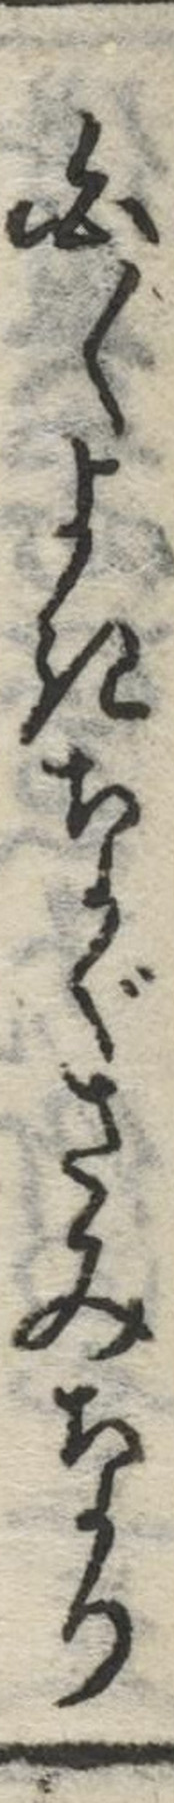白くよきなぐさみなり
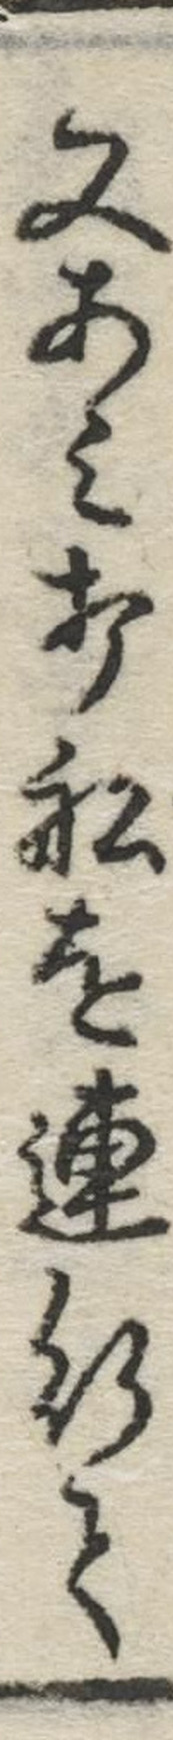又あみ打舩を連行て
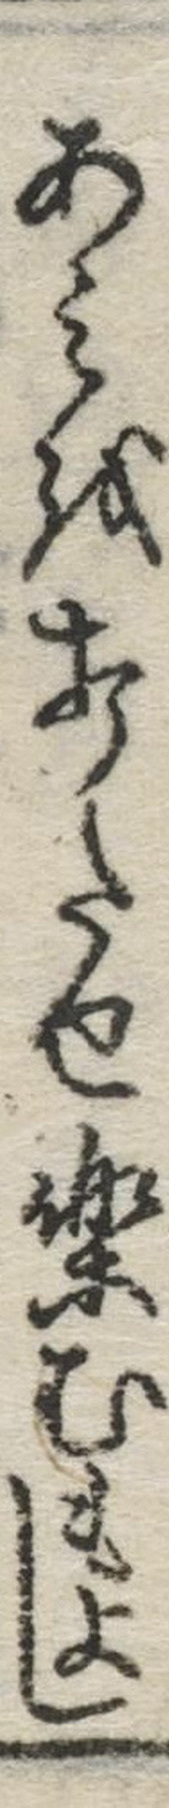あみを打たせ楽むもよし
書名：但州城崎浴湯辧
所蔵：東京大学地震研究所図書室 Earthquake Research Institute Library, The University of Tokyo, JAPAN
